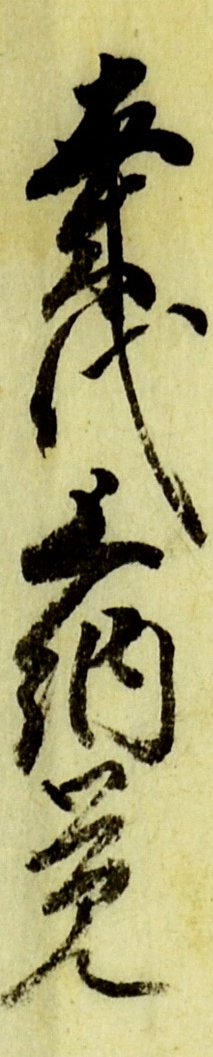桑代上納覚
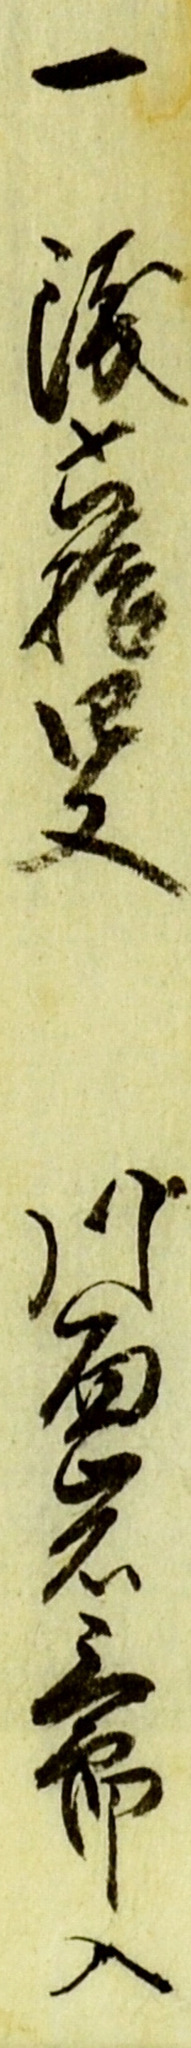一銭六拾四文川面岩三郎入
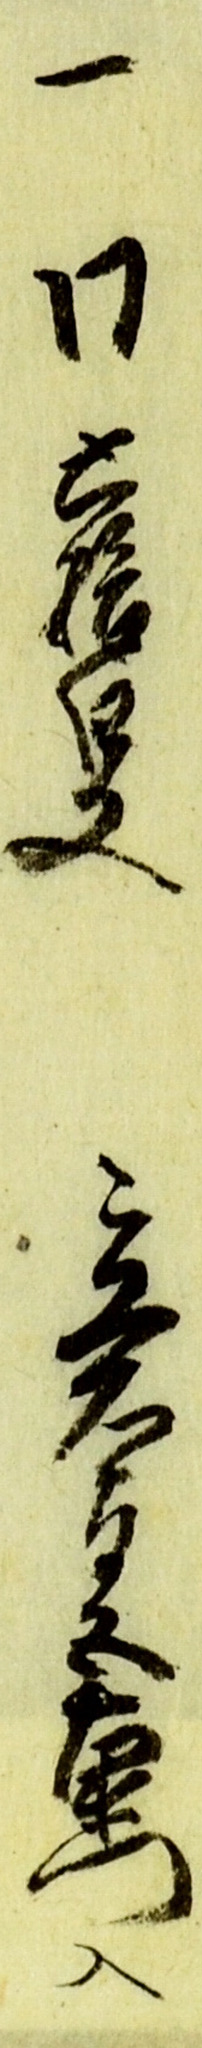一同六拾四文立石与五右衛門入
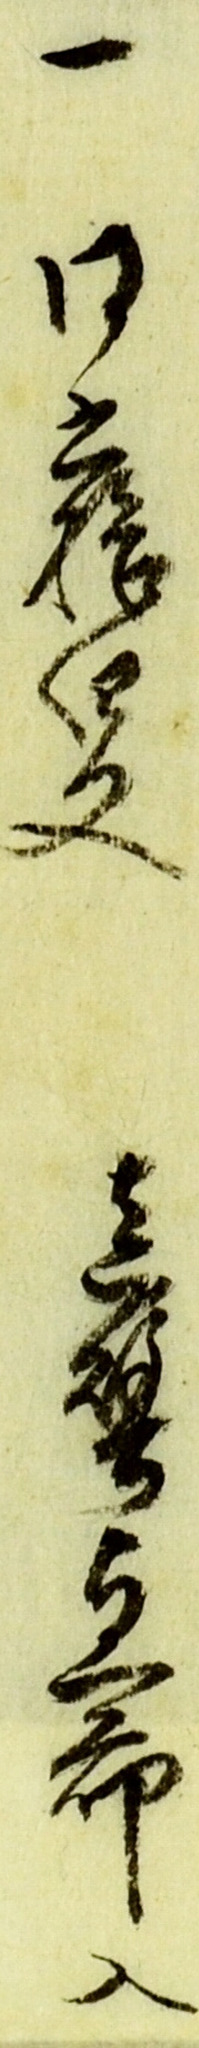一同六拾四文真壁与一郎入
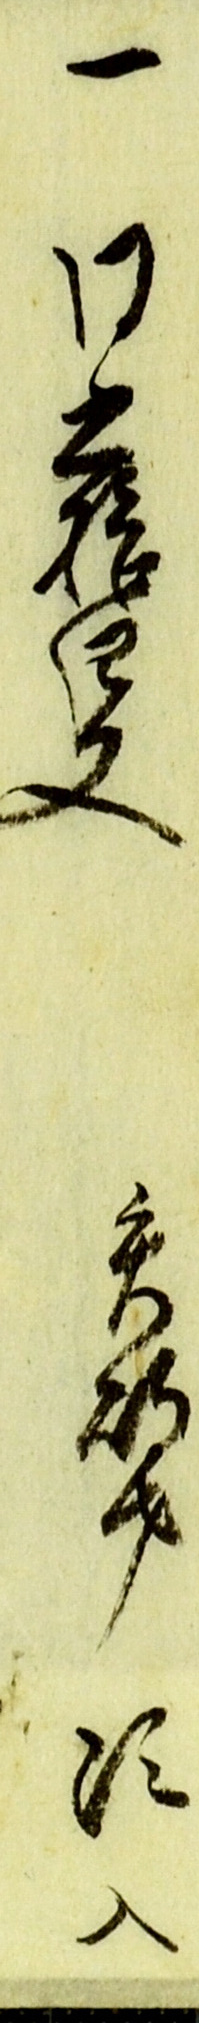一同六拾四文矢嶋才次入
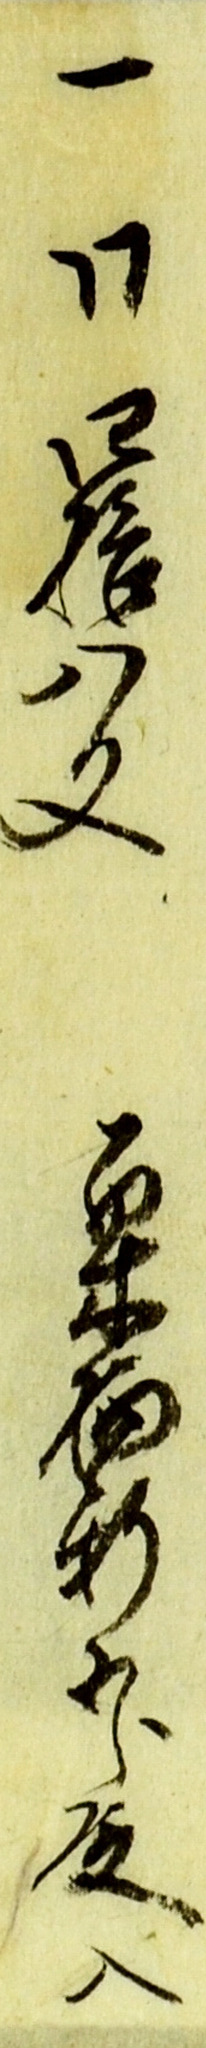一同四拾八文栗柄新五郎殿入
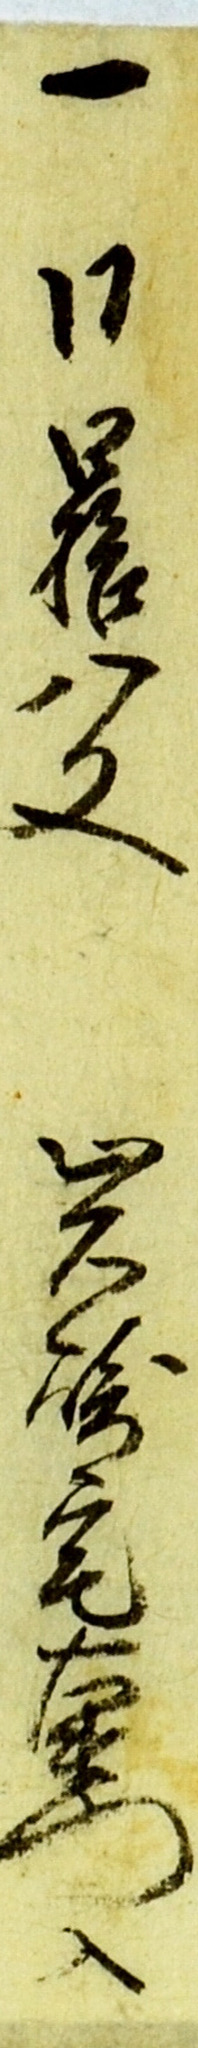一同四拾八文岩崎宅右衛門入
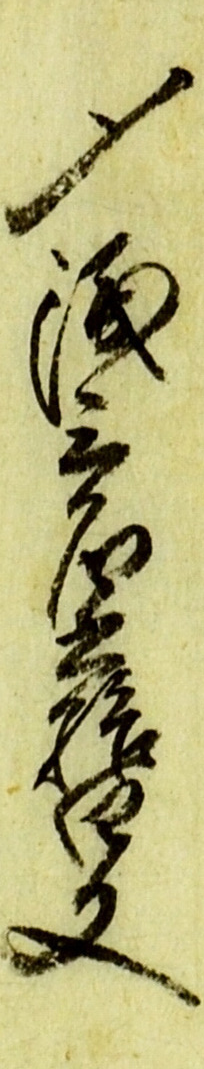〆銭三百六拾四文
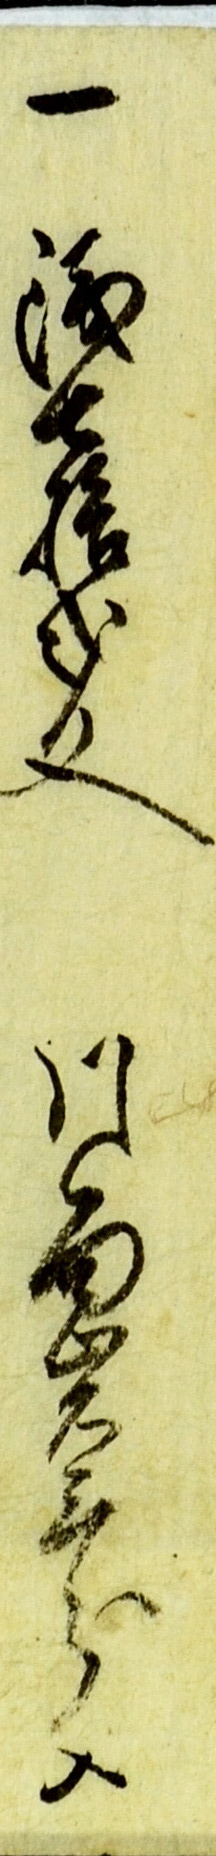一銭七拾弐文川面岩三郎入
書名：桑代上納覚
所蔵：伊那市立高遠町図書館・合同会社AMANE
